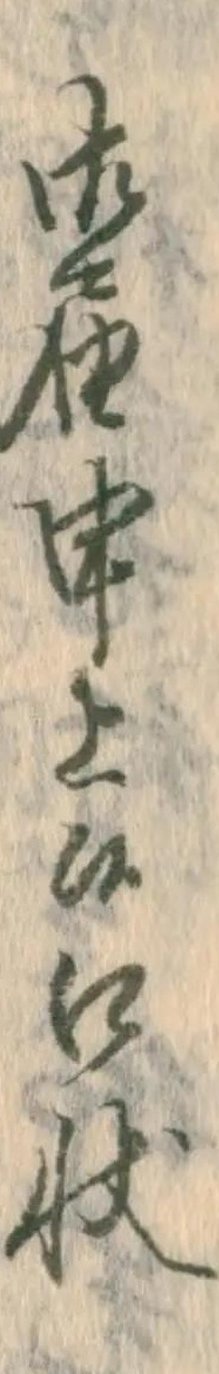御届申上候口状
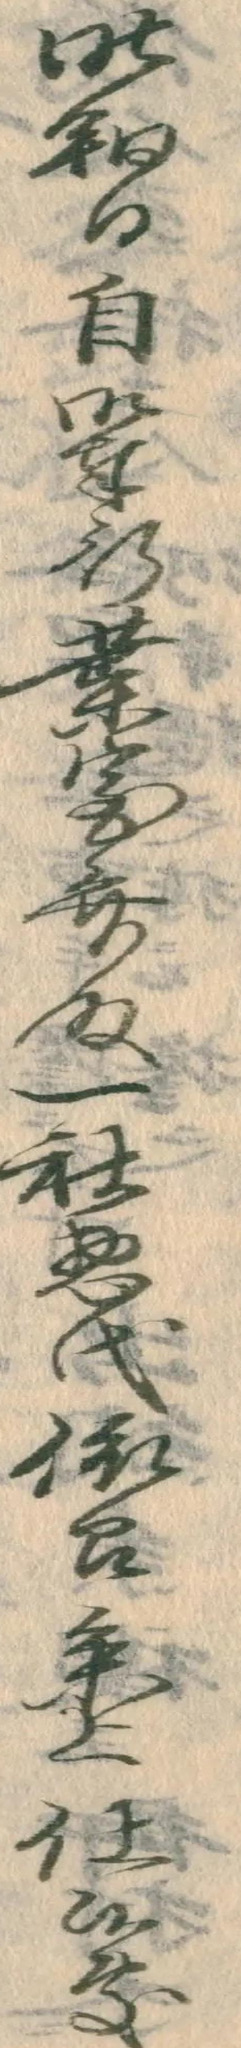昨朔日自御奉行葉室弁殿一社惣代依召参上仕候処
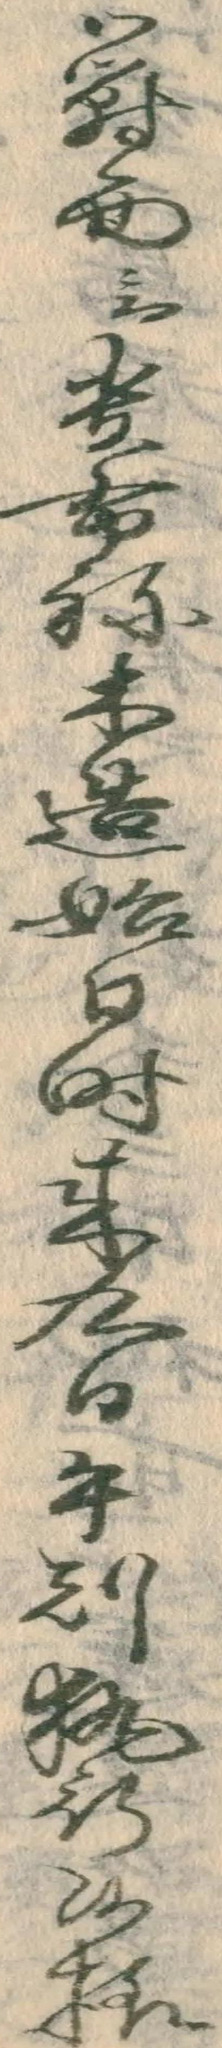御対面ニ而貴布祢木造始日時来九日午刻執行候様
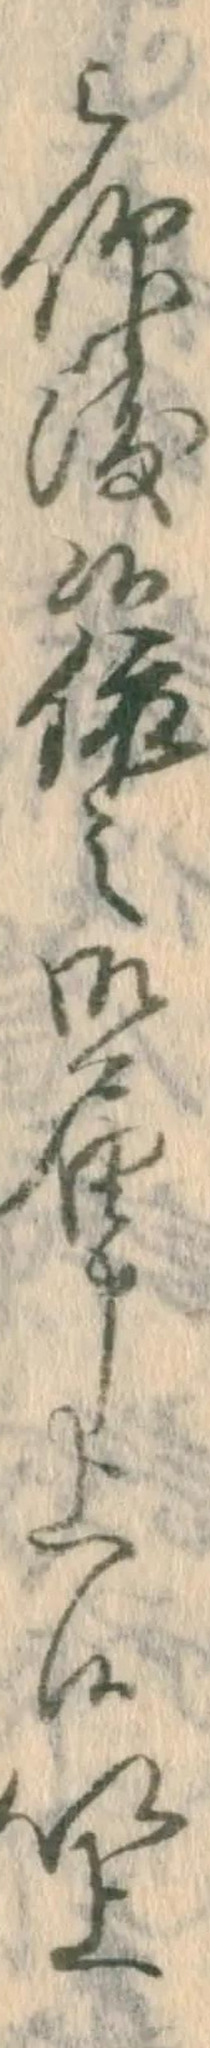被仰渡候依之御届申上候以上
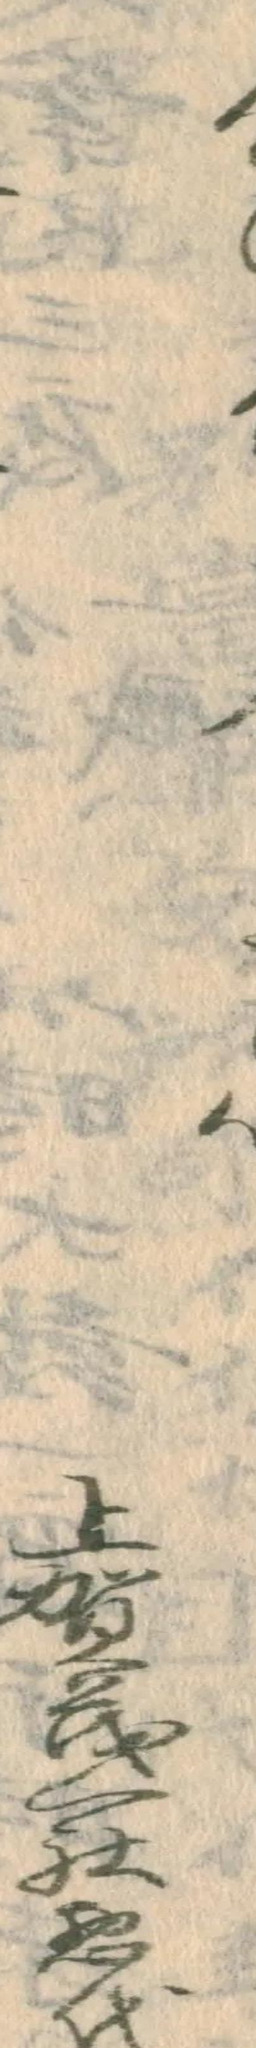上賀茂一社惣代
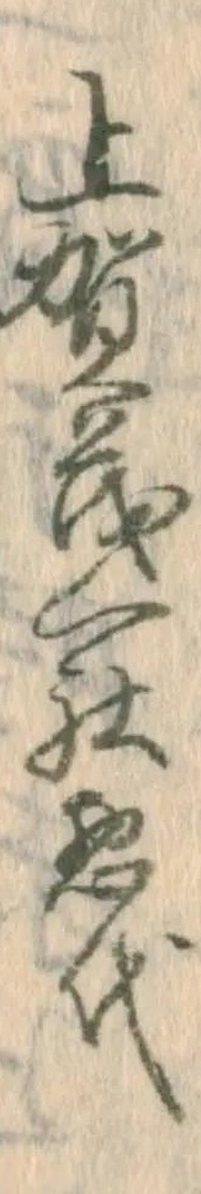上賀茂一社惣代
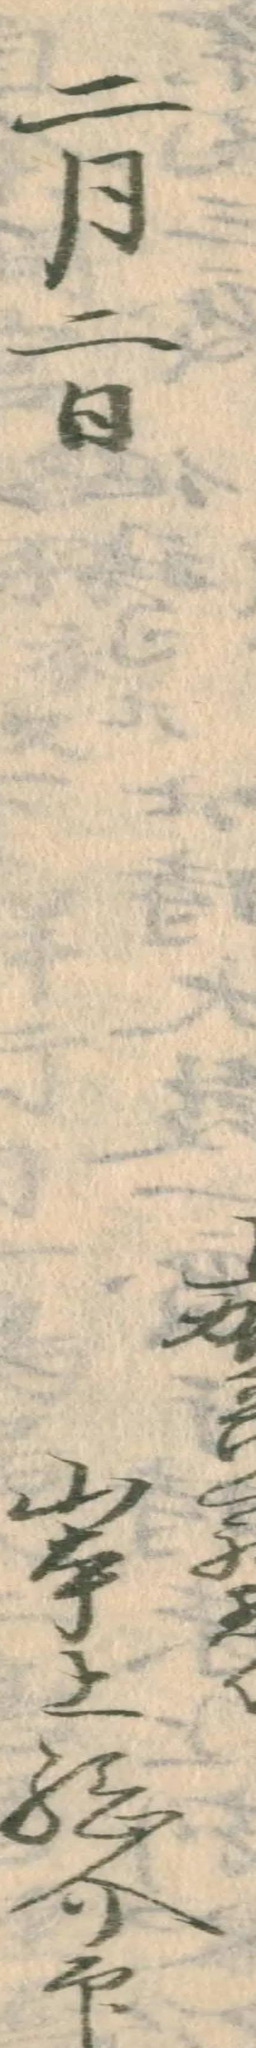二月二日山本上総介印
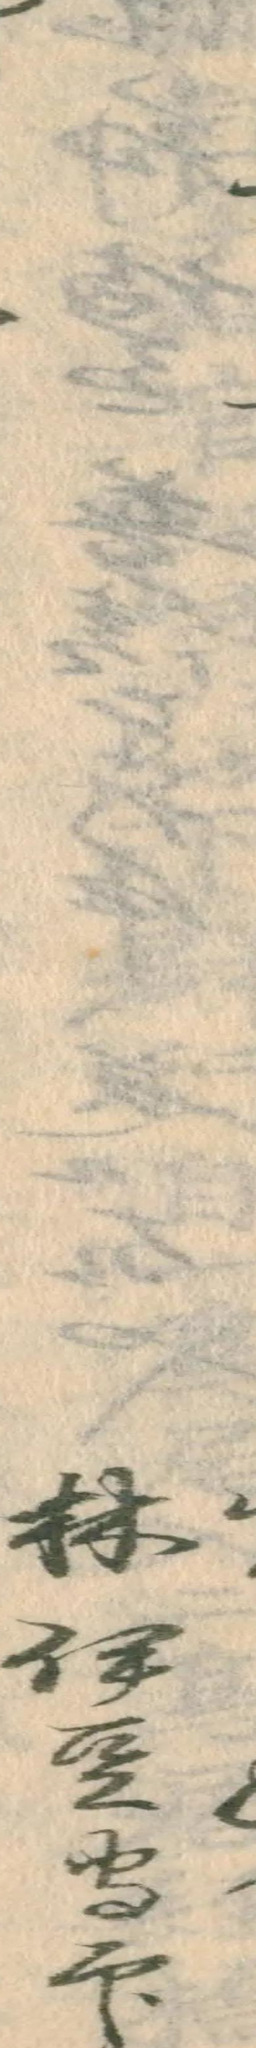林伊豆守印
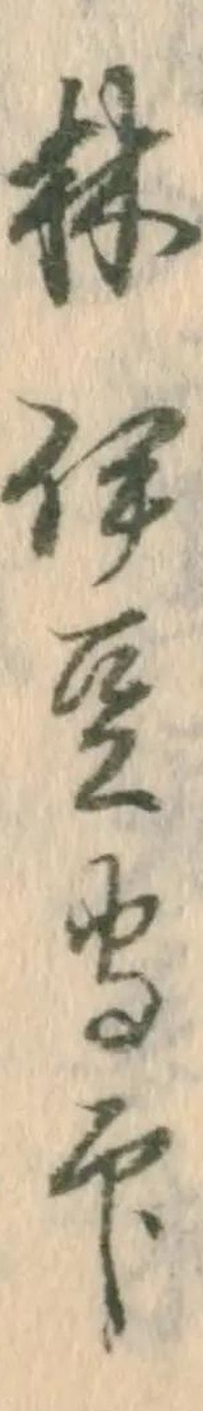林伊豆守印
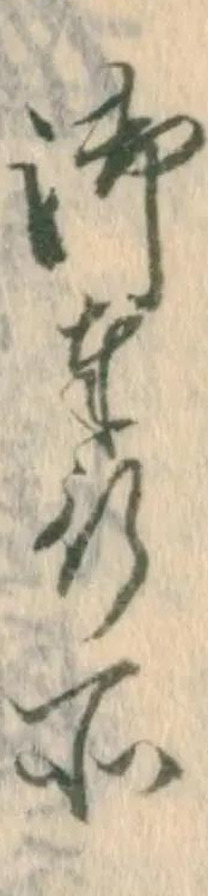御奉行所
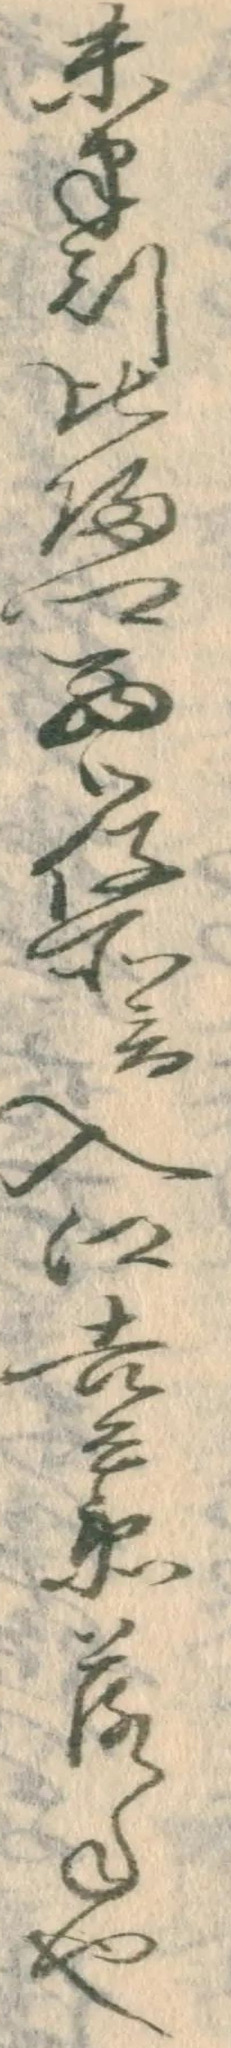未半刻比帰郷西御役所ニ而入江吉兵衛落手也
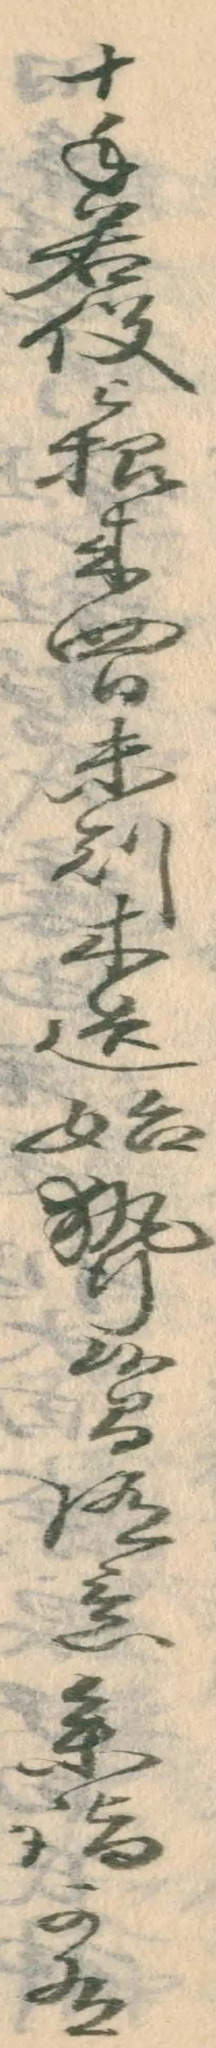一十手若役被招来四日未刻木造始執行候間随意参詣可有
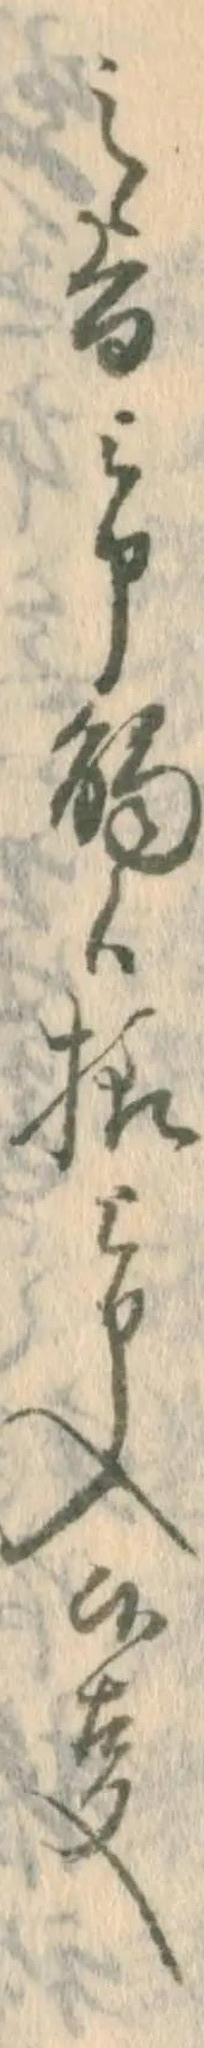之旨被申触候様被申入候事
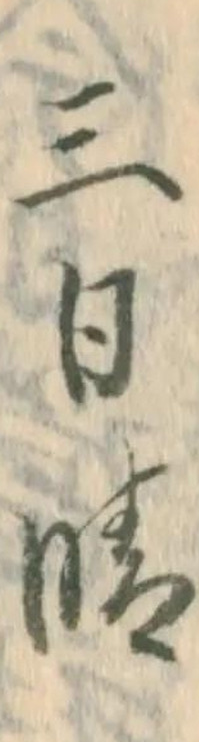三日晴
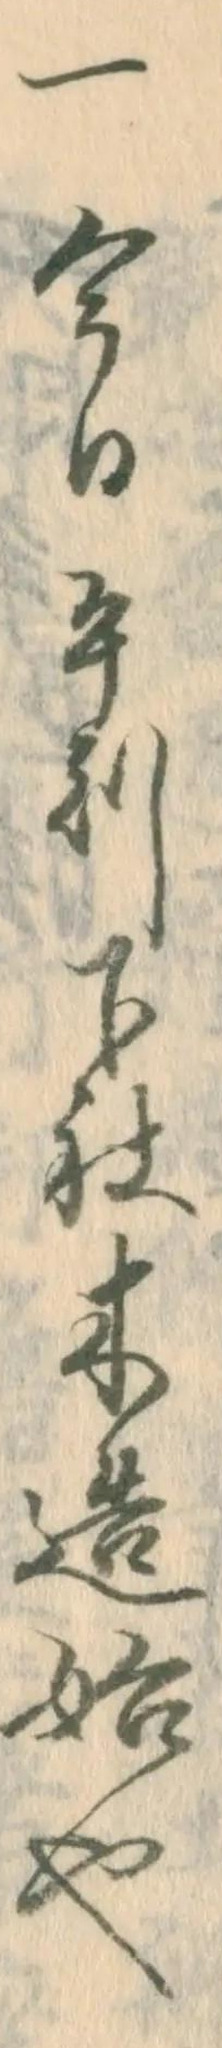一今日午刻下社木造始也

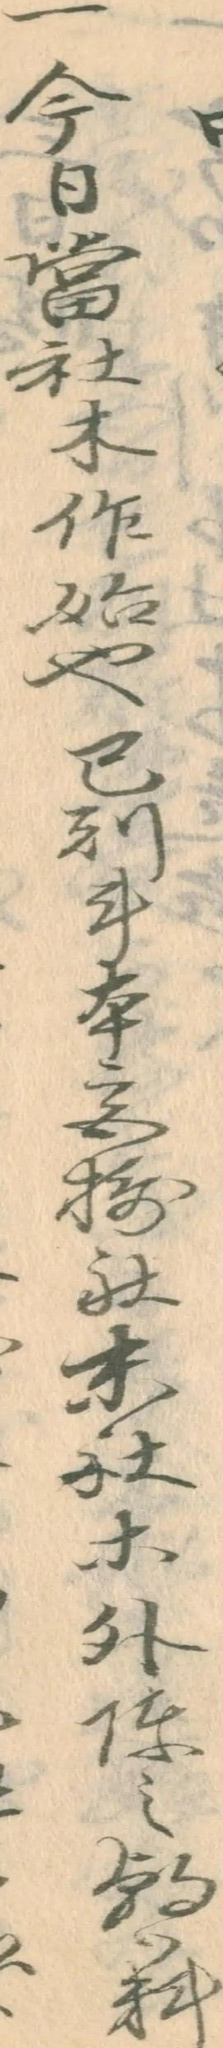一今日当社木作始也巳刻計本宮摂社末社等外陣之朝御料
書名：賀茂社記録. 第17冊
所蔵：国立国会図書館 National Diet Library, JAPAN
